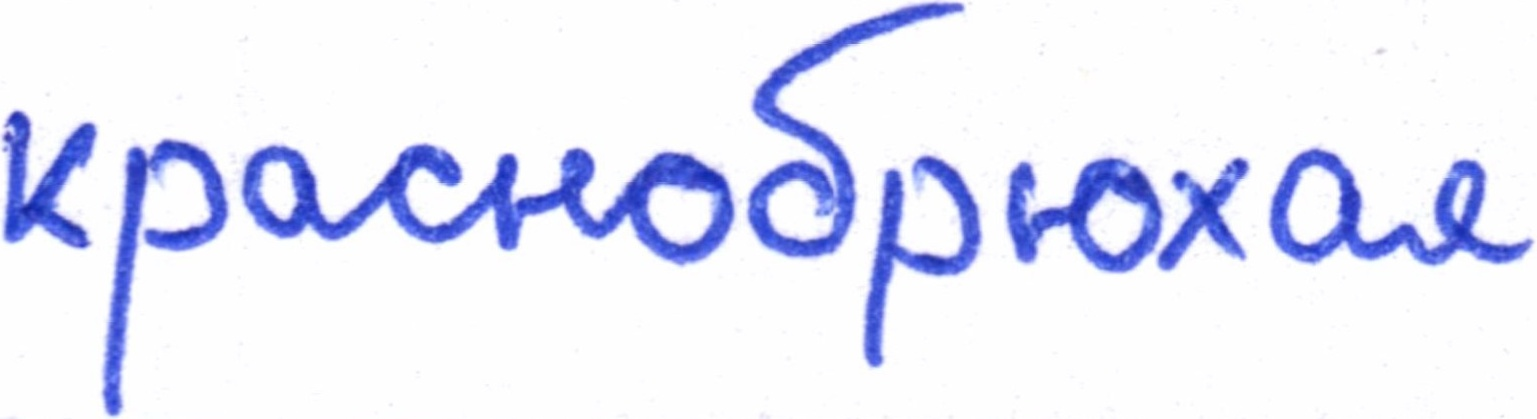краснобрюхая
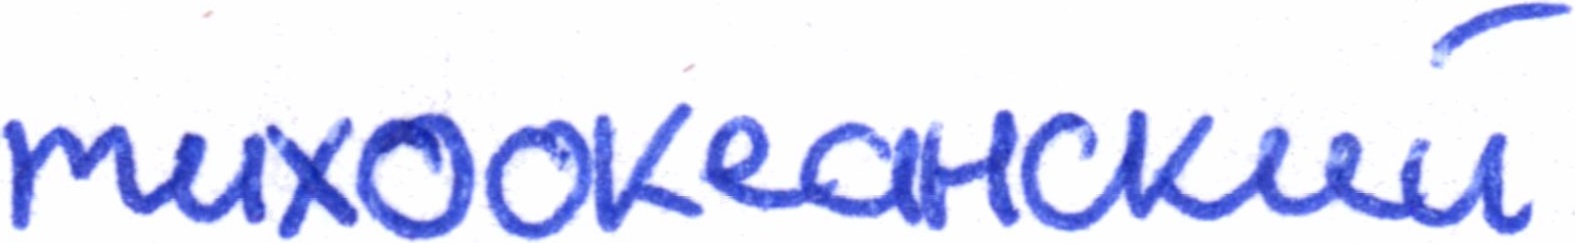тихоокеанский
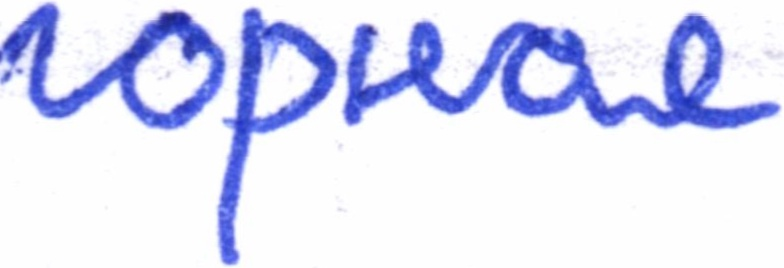горная
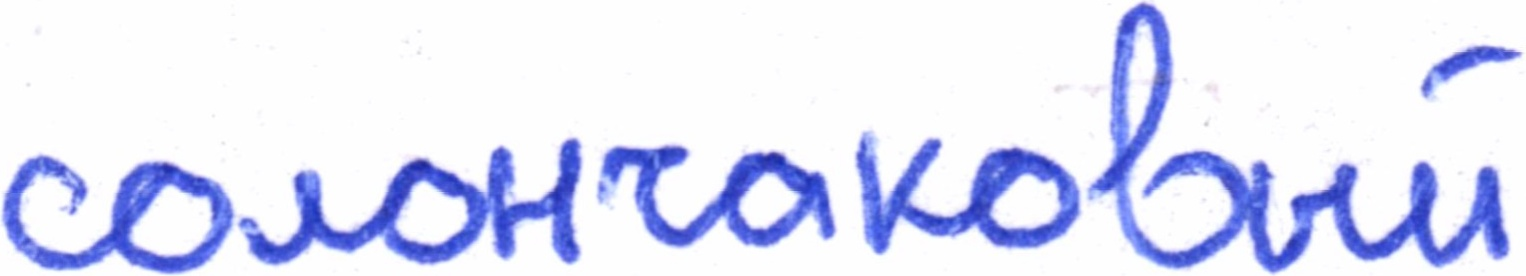солончаковый
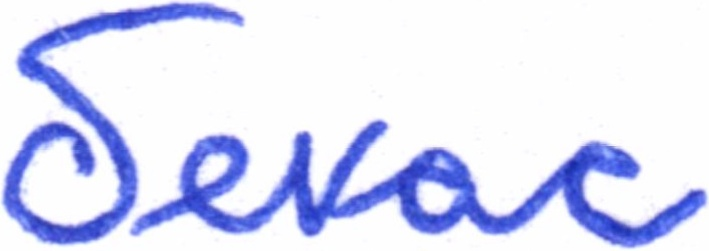бекас
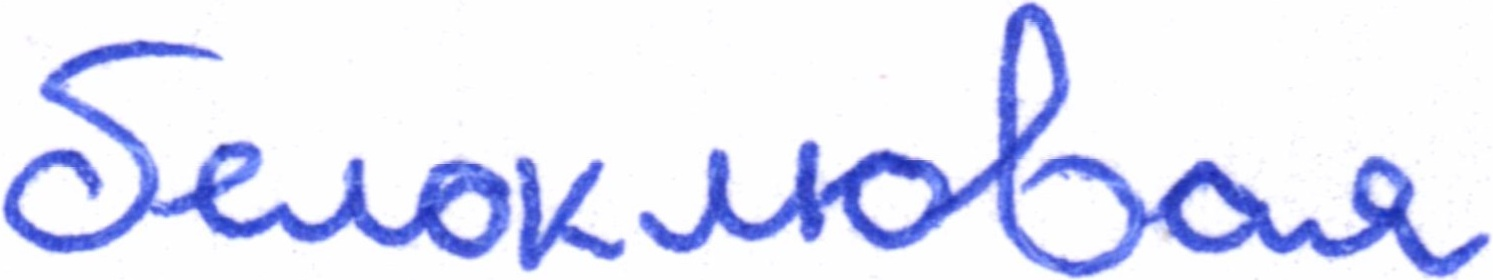белоклювая
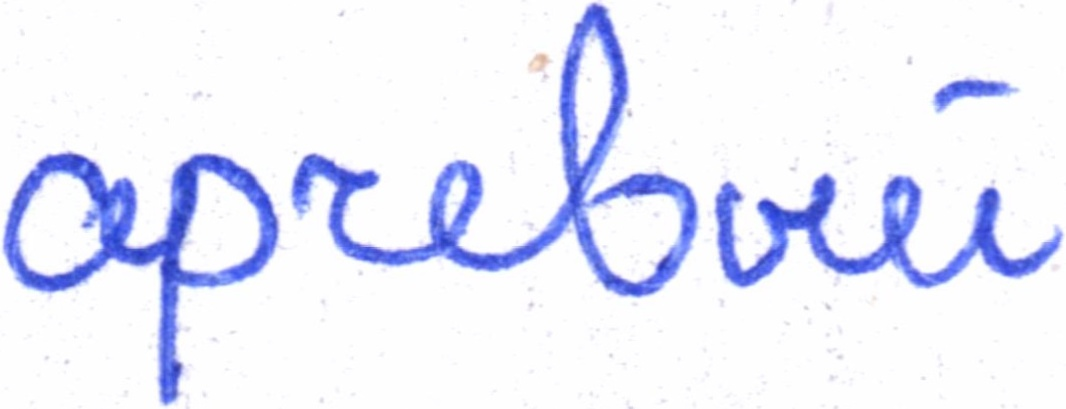арчевый
